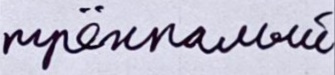трёхпалый
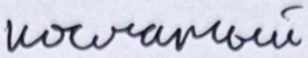косматый
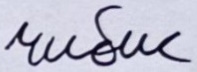чибис
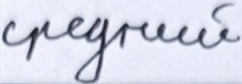средний
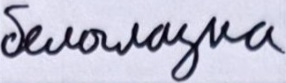белоглазка
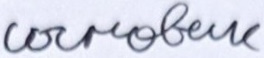сосновик
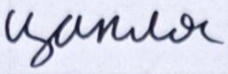цапля
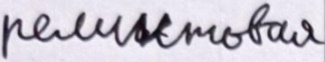реликтовая
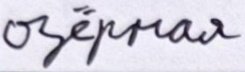озёрная
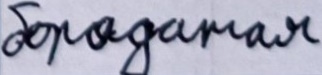бородатая
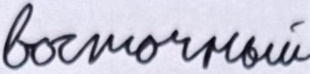восточный
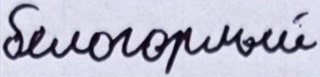бело горлый
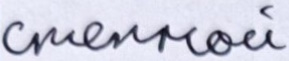степной
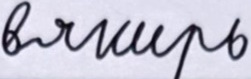вяхирь
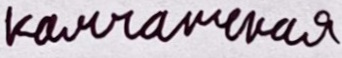камчатская
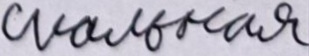скальная
